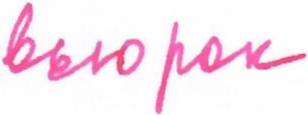вьюрок
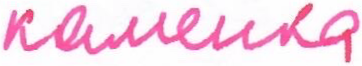каменка
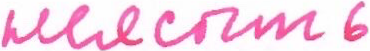неясыть
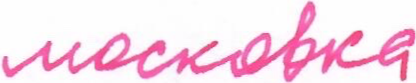московка
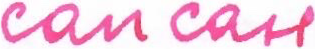сапсан
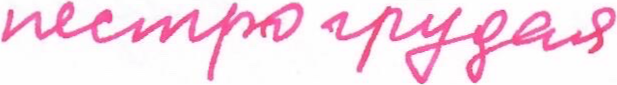пестрогрудая
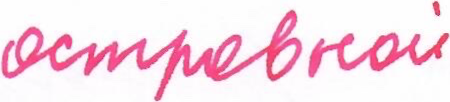островной
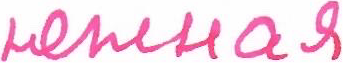южная
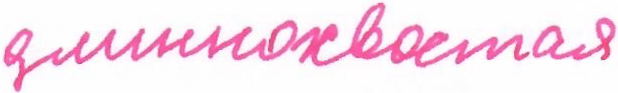длиннохвостая
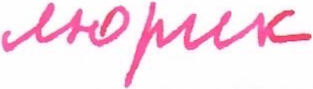люрик
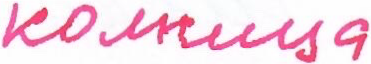колпица
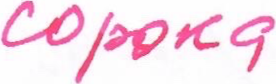сорока
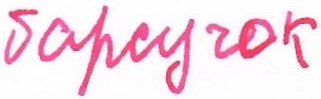барсучок
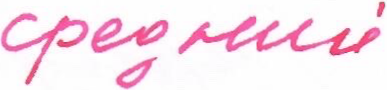средний
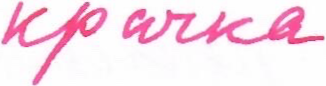крачка
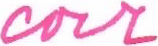сыч
